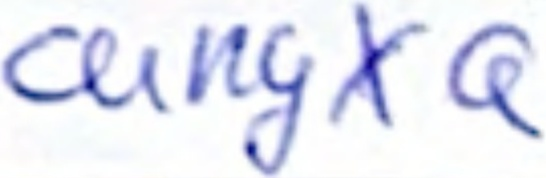сипуха
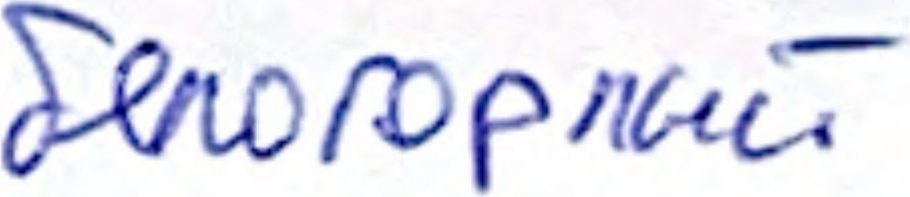белогорлый
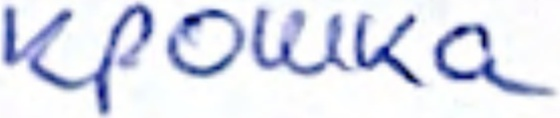крошка
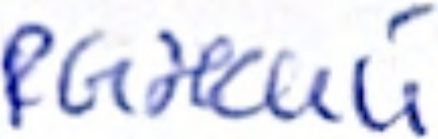рыжий
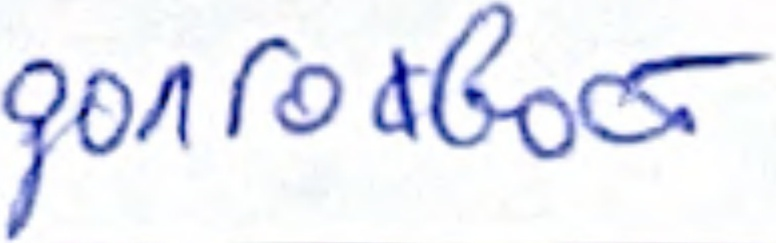долгохвост
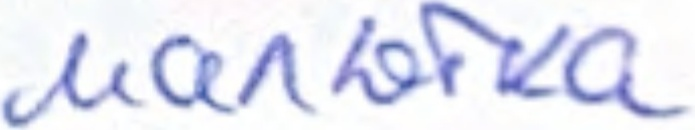малютка
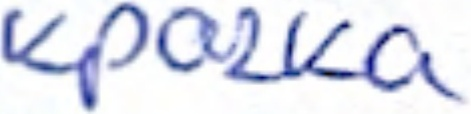крачка
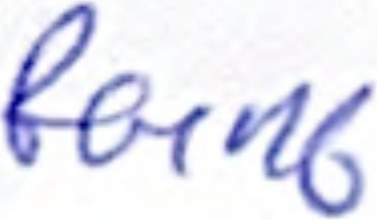выпь
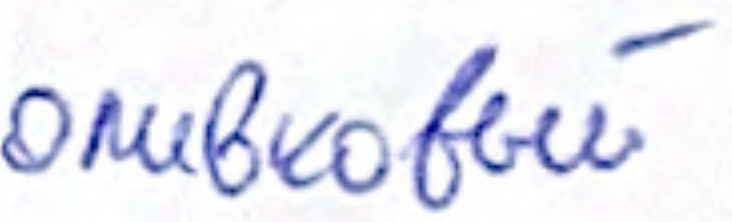оливковый
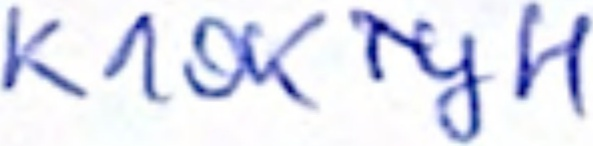клоктун
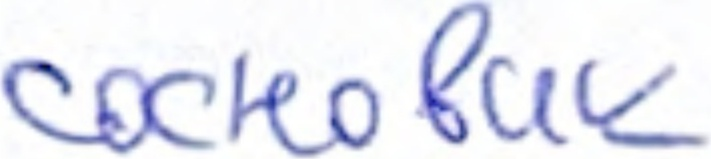сосновик
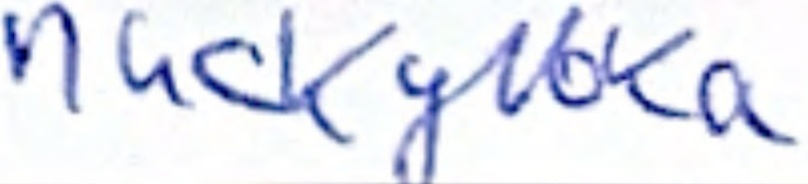пискулька
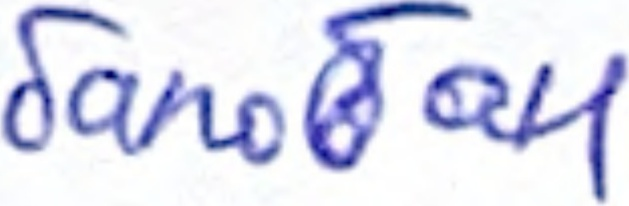балобан
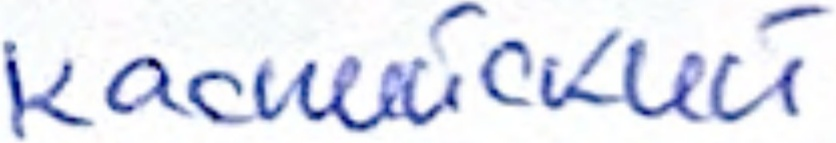каспийский
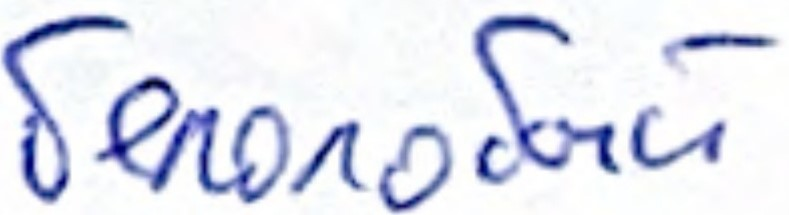белолобый
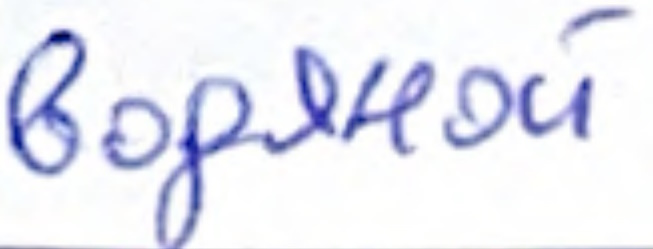водяной
